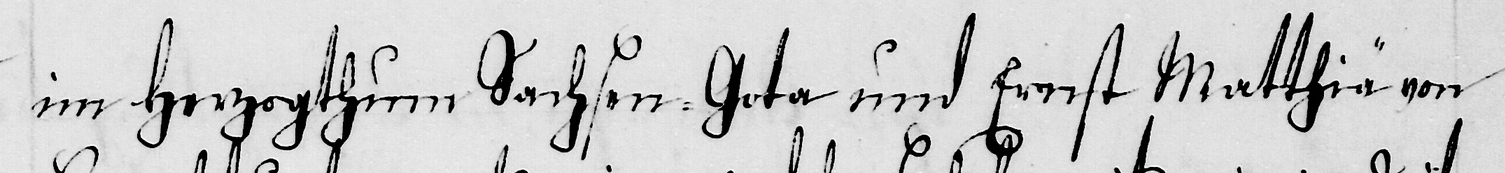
im Herzogthum Sachsen-Gota und Ernst Matthiä von
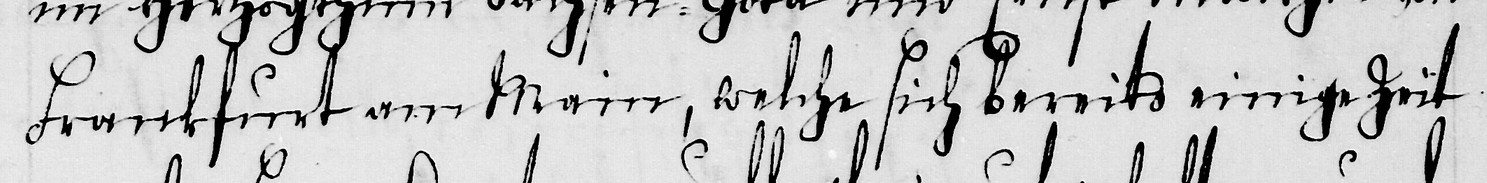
Frankfurt am Main, welche sich bereits einige Zeit
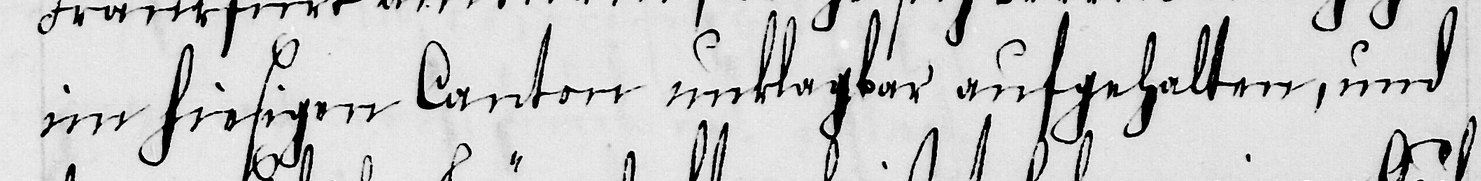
im hiesigen Canton unklagbar aufgehalten, und
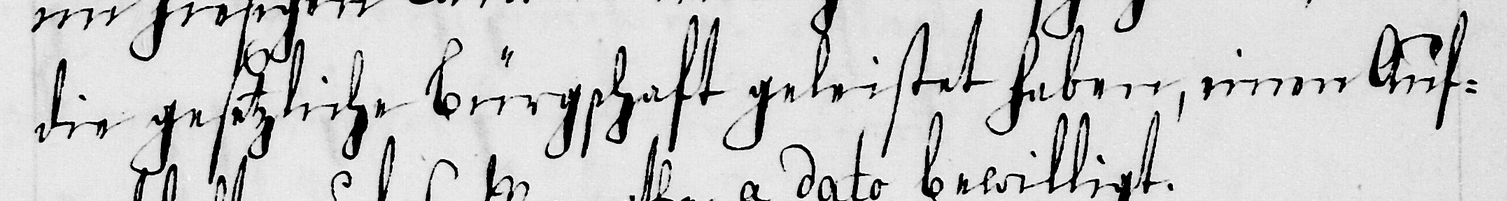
die gesetzliche Bürgschaft geleistet haben, einen Auf¬
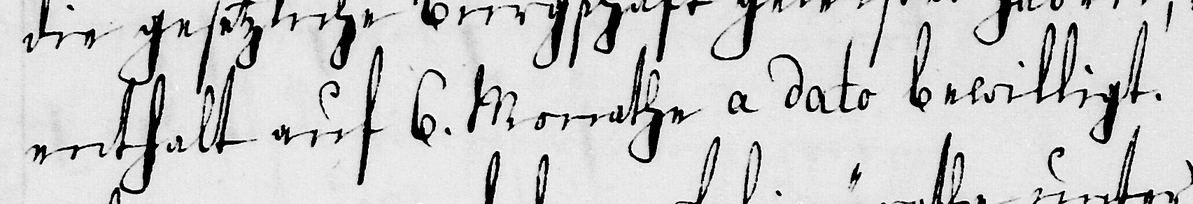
enthalt auf 6. Monathe a dato bewilligt.
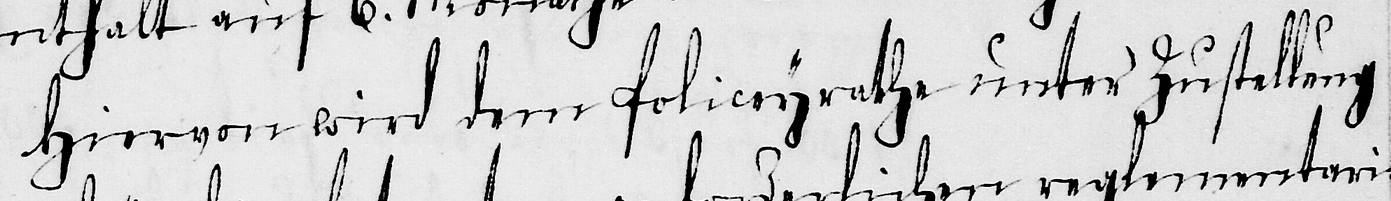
Hiervon wird dem Policeyrathe unter Zustellung
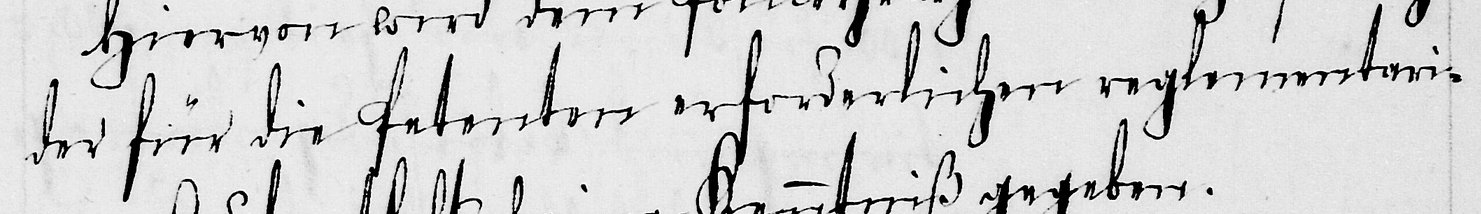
der für die Petenten erforderlichen reglementari¬
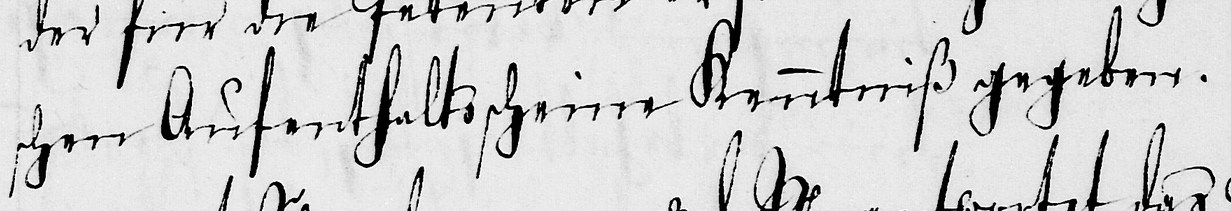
schen Aufenthaltsscheine Kenntniß gegeben.
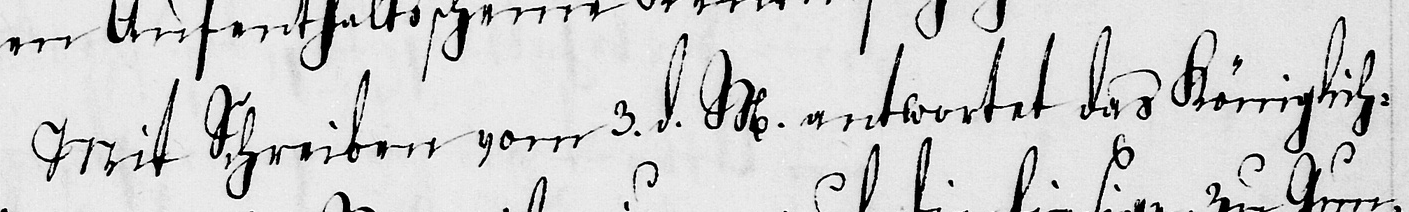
Mit Schreiben vom 3. d. M. antwortet das Königlic¬
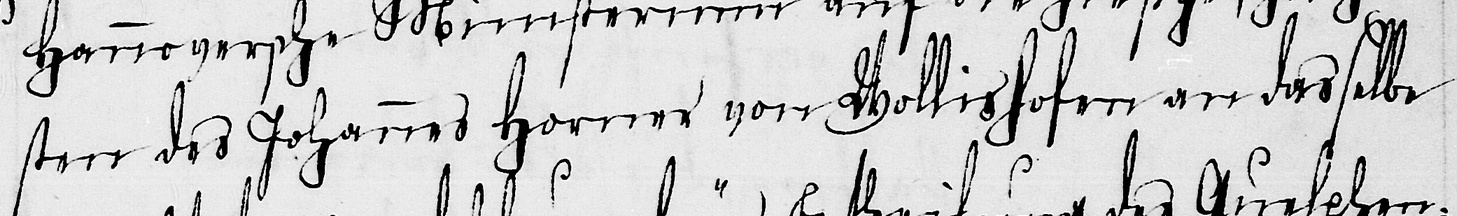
sten des Johannes Horner von Wollishofen an das selbe
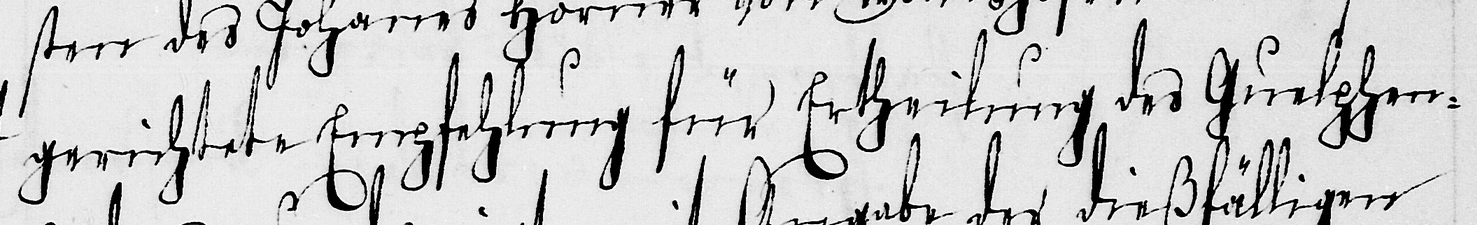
gerichtete Empfehlung für Ertheilung des Guelphe¬
